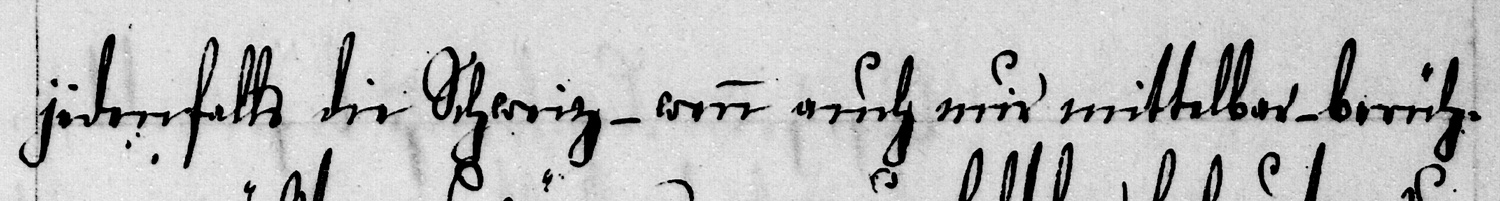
jedenfalls die Schweiz – wenn auch nur mittelbar – berüh¬
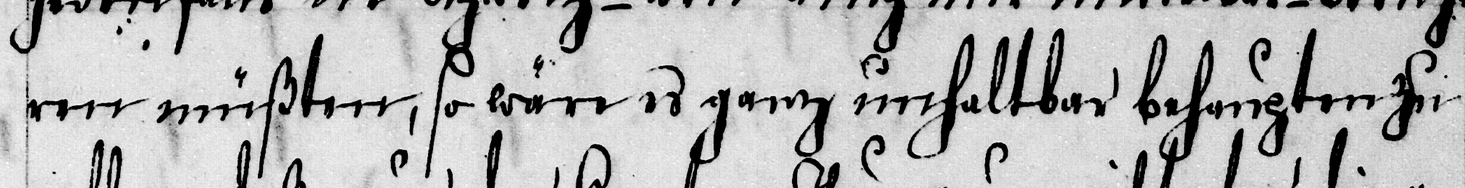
ren müßten, so wäre es ganz unhaltbar behaupten zu
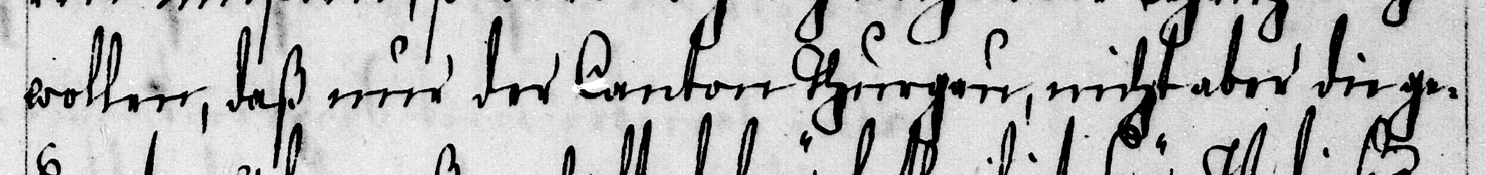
wollen, daß nur der Canton Thurgau, nicht aber die ge¬
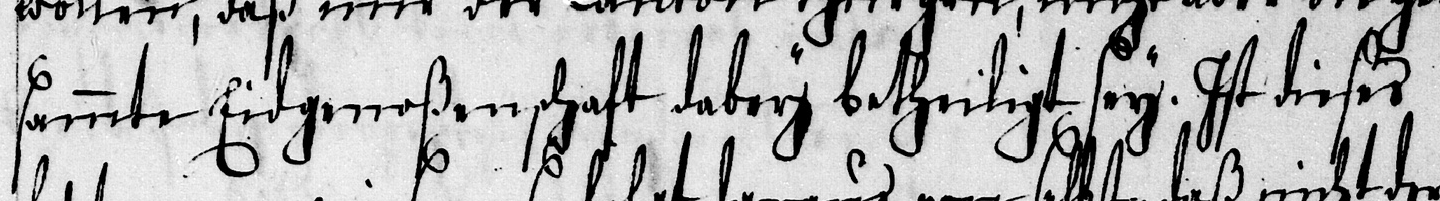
sammte Eidgenoßenschaft dabey betheiligt sey. Ist dieses
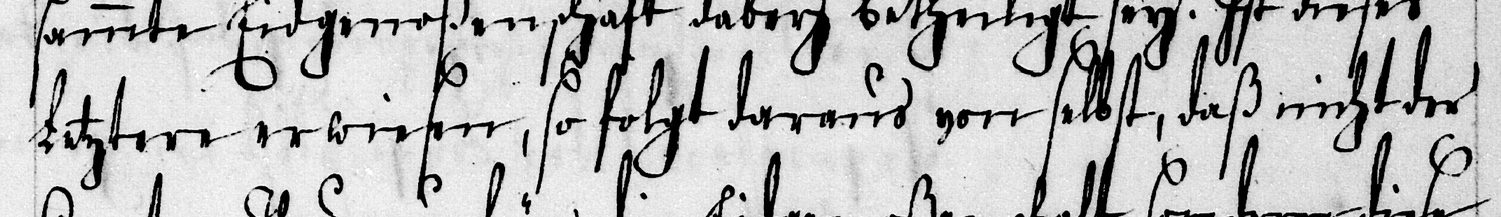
Letztere erwiesen, so folgt daraus von selbst, daß nicht der
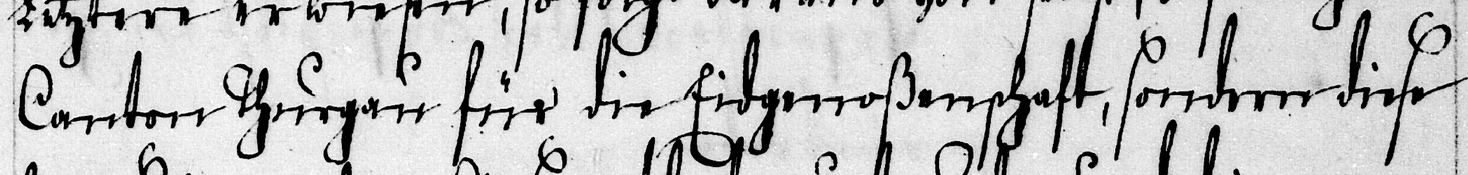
Canton Thurgau für die Eidgenoßenschaft, sondern diese
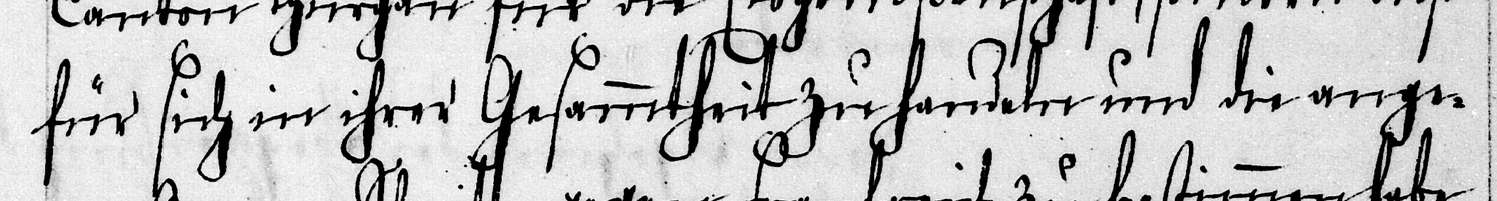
für sich in ihrer Gesammtheit zu handeln und die ange¬
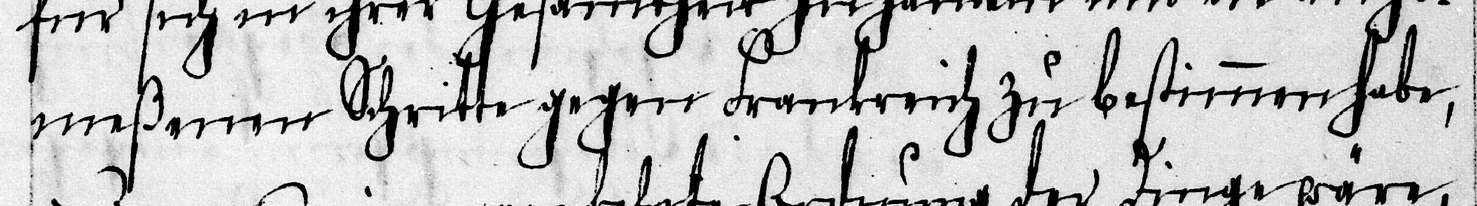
meßenen Schritte gegen Frankreich zu bestimmen habe,
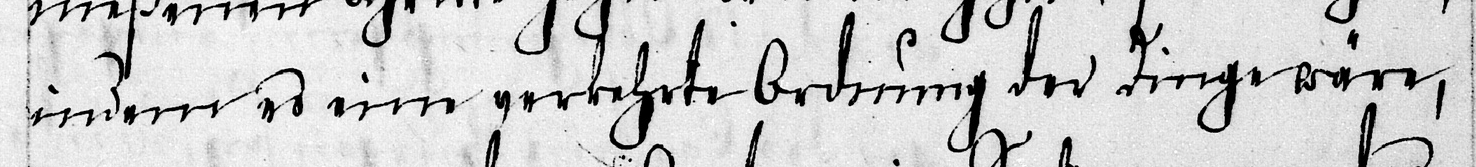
indem es eine verkehrte Ordnung der Dinge wäre,
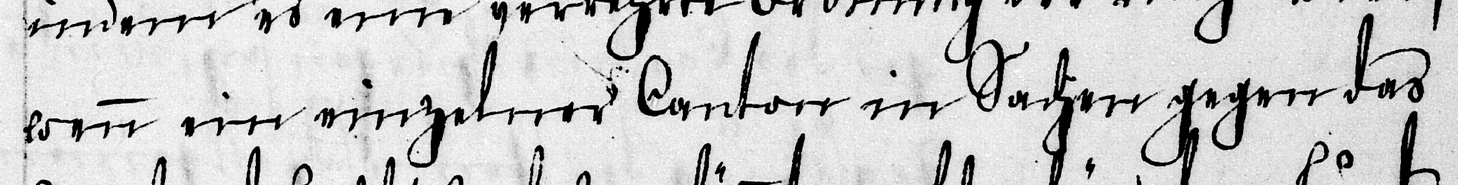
wenn ein einzelner Canton in Sachen gegen das
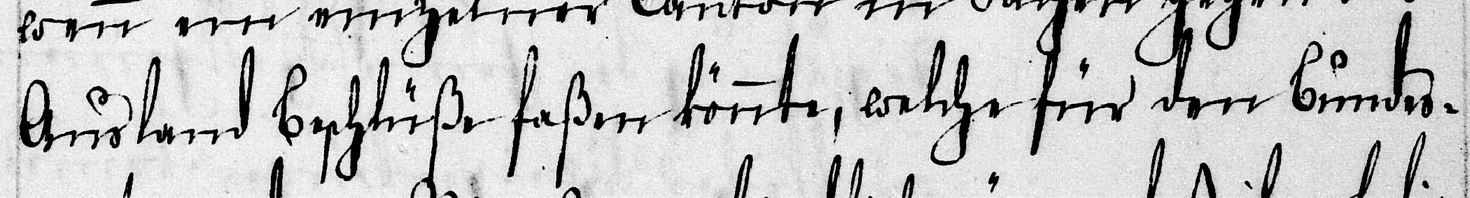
Ausland Beschlüße faßen könnte, welche für den Bundes¬
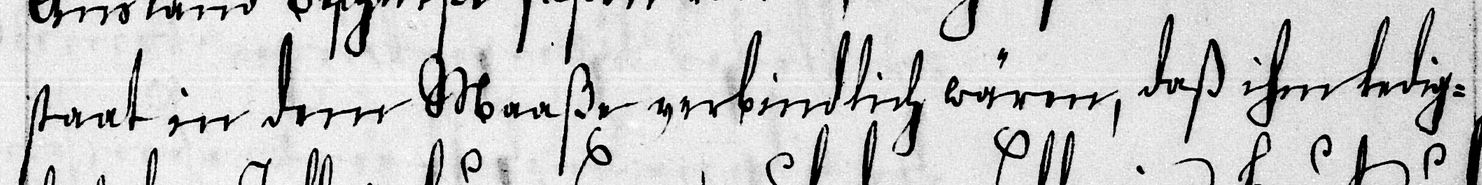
staat in dem Maaße verbindlich wären, daß ihm ledig¬
